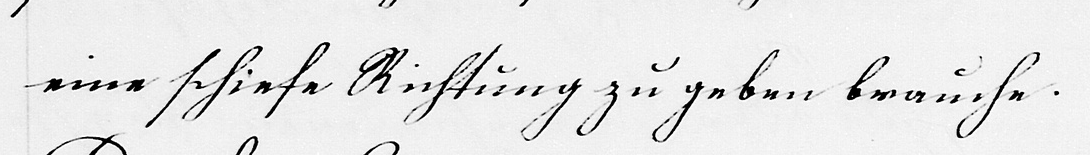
eine schiefe Richtung zu geben brauche.
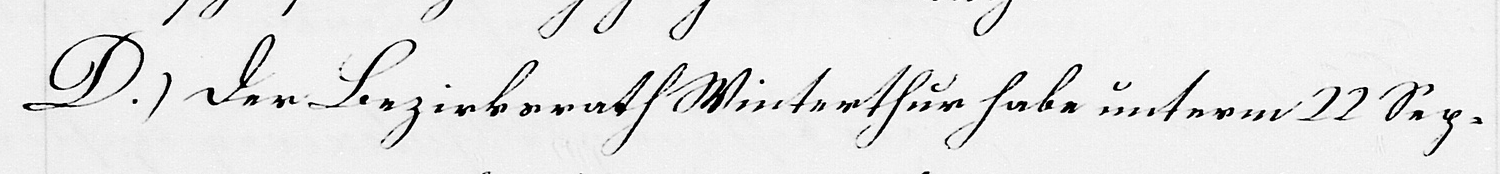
D.) Der Bezirksrath Winterthur habe unterm 22 Sep¬
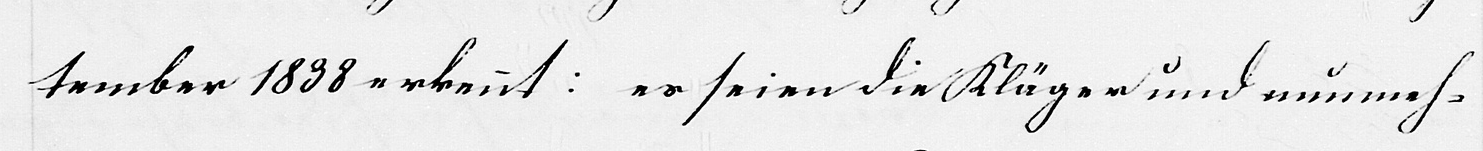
tember 1838 erkennt: es seien die Kläger und nunmeh¬
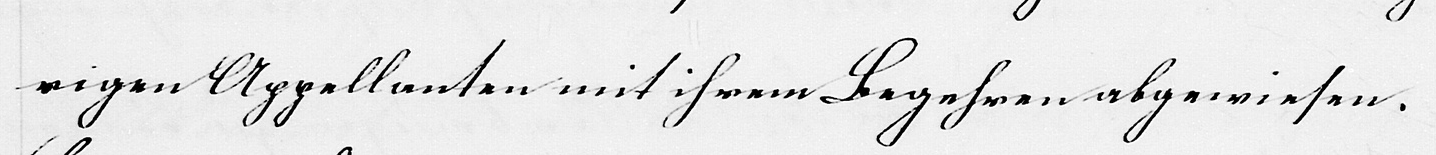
rigen Appellanten mit ihrem Begehren abgewiesen.
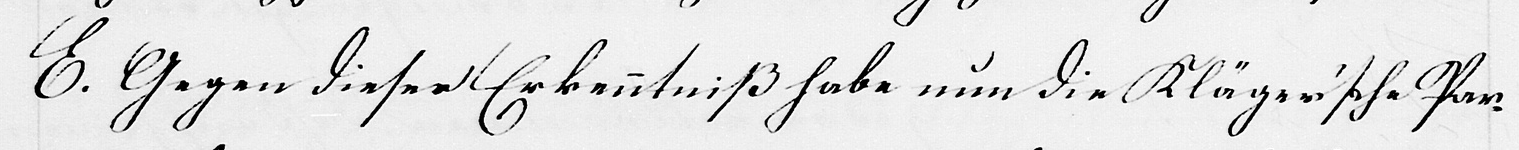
E. Gegen dieses Erkenntniß habe nun die Kläger’sche Par¬
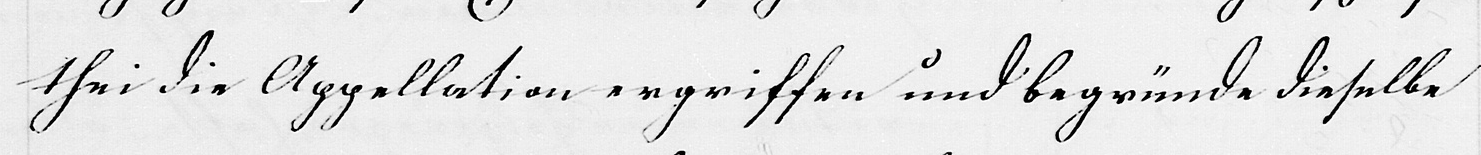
thei die Appellation ergriffen und begründe dieselbe
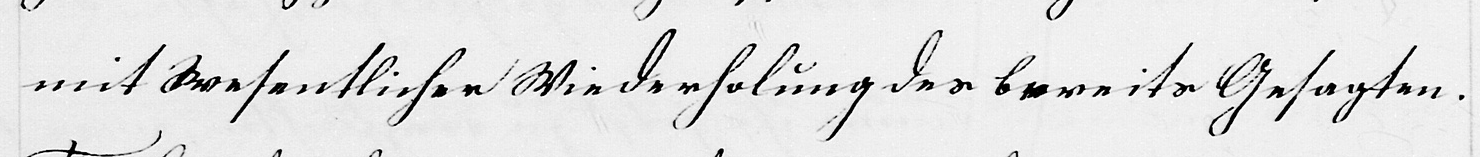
mit wesentlicher Wiederholung des bereits Gesagten.
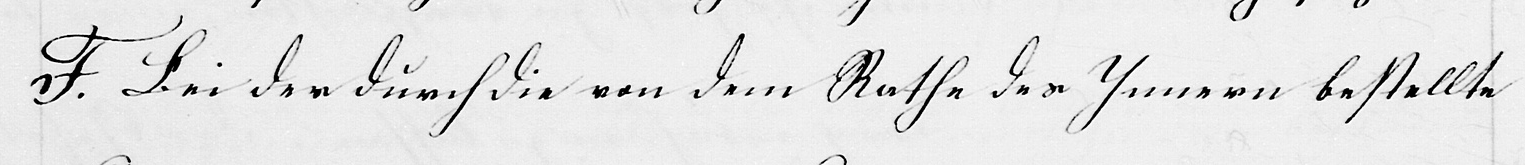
F. Bei der durch die von dem Rathe des Innern bestellte
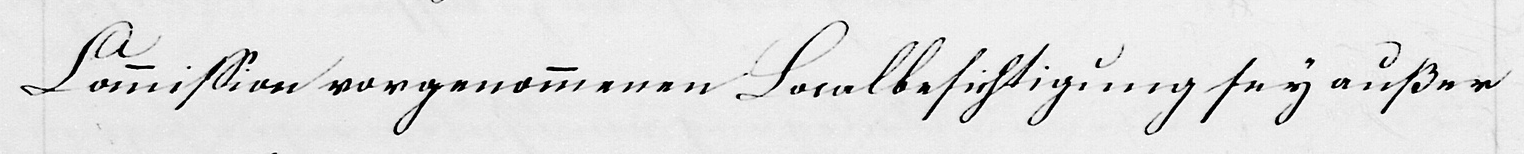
Commißion vorgenommenen Localbesichtigung sey außer
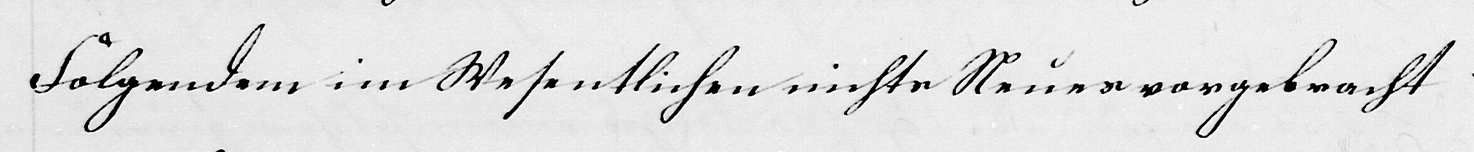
Folgendem im Wesentlichen nichts Neues vorgebracht
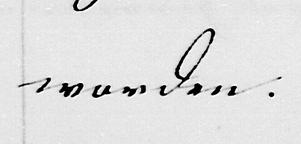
worden.
